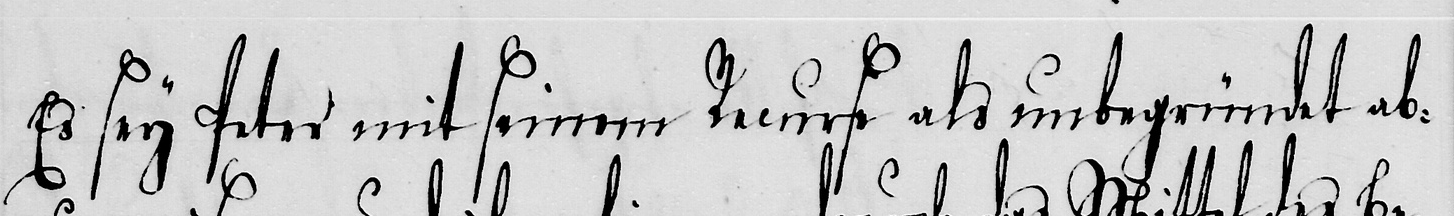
Es sey Peter in seinem Recurse als unbegründet ab¬
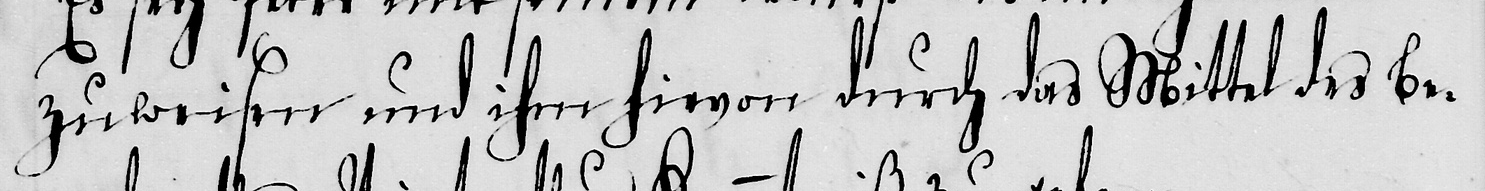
zuweisen und ihm hievon durch das Mittel des Be¬
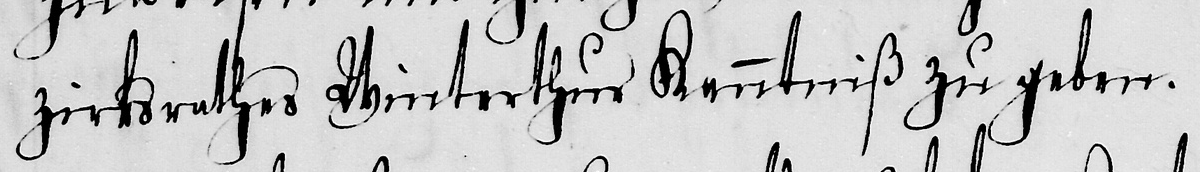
zirksrathes Winterthur Kenntniß zu geben.
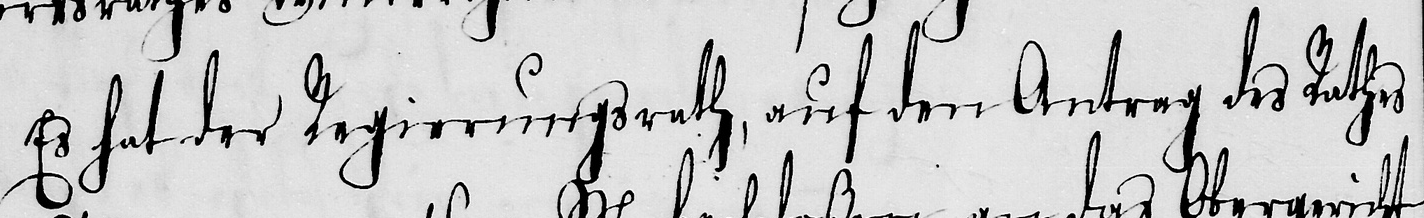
Es hat der Regierungsrath, auf den Antrag des Rath¬
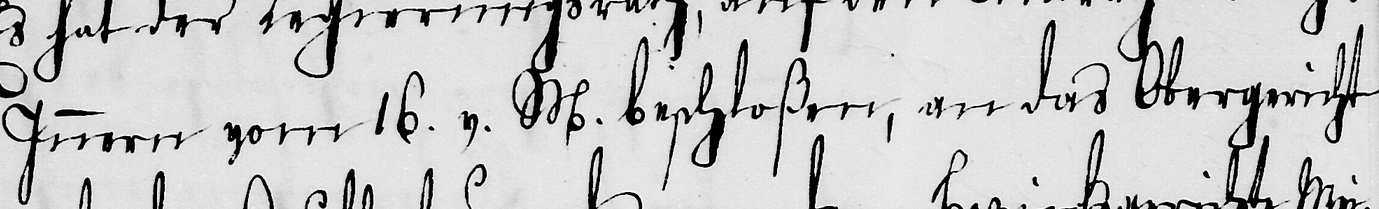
Innern vom 16. v. M. beschloßen, an das Obergericht
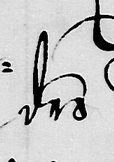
des
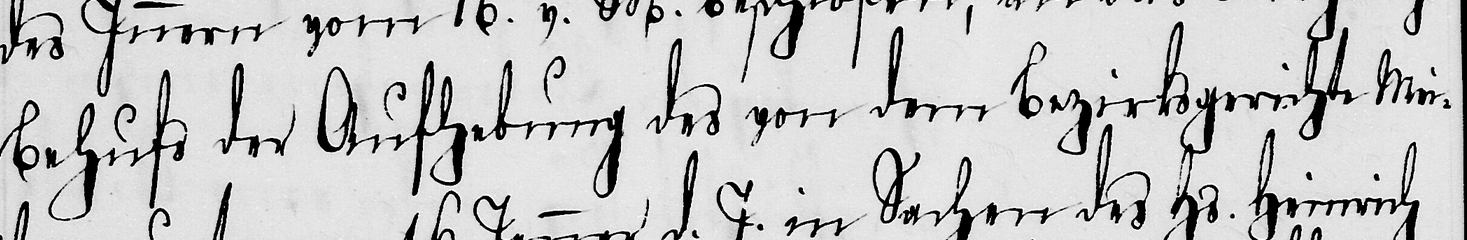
Behufs der Aufhebung des von dem Bezirksgerichte Me¬
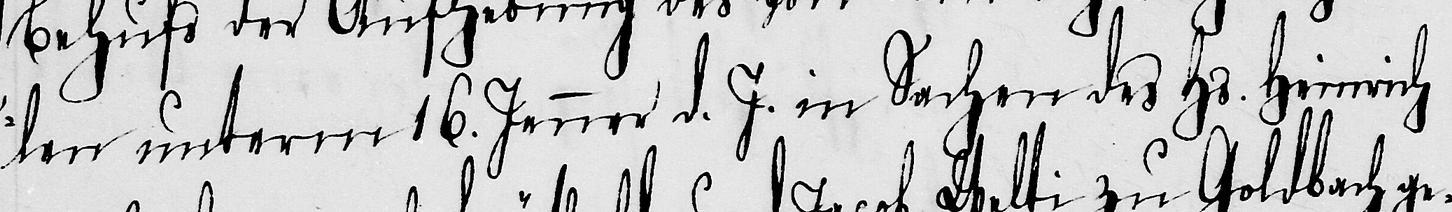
ilen unterm 16. Jenner d. J. in Sachen des Hs. Heinrich
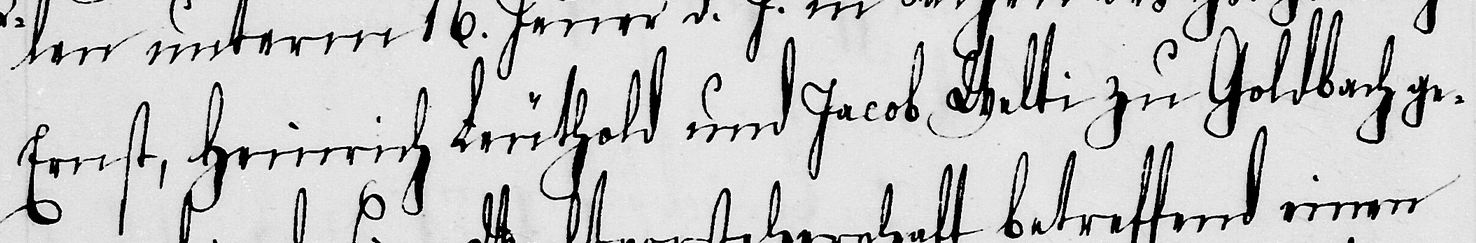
Ernst, Heinrich Leuthold und Jacob Welti zu Goldberg g¬
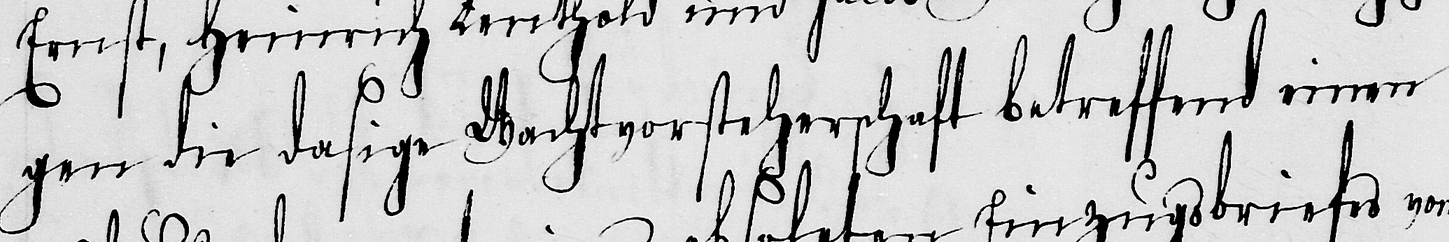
egen die dasige Wachtvorsteherschaft betreffend einen
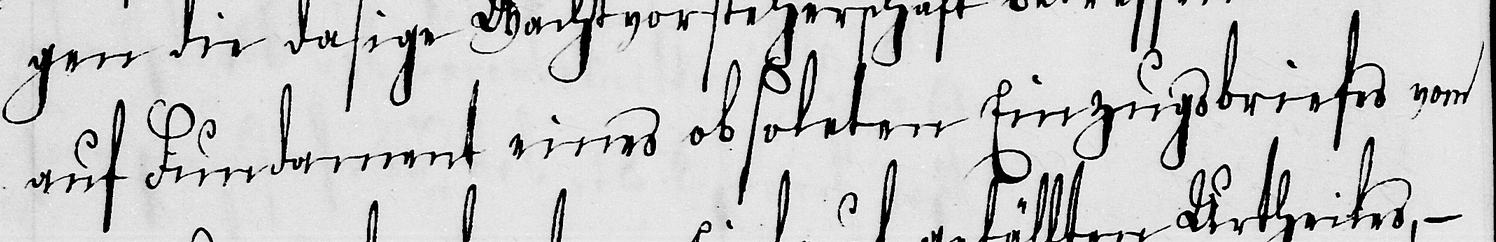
auf Fundament eines obsoleten Einzugsbriefes vom
